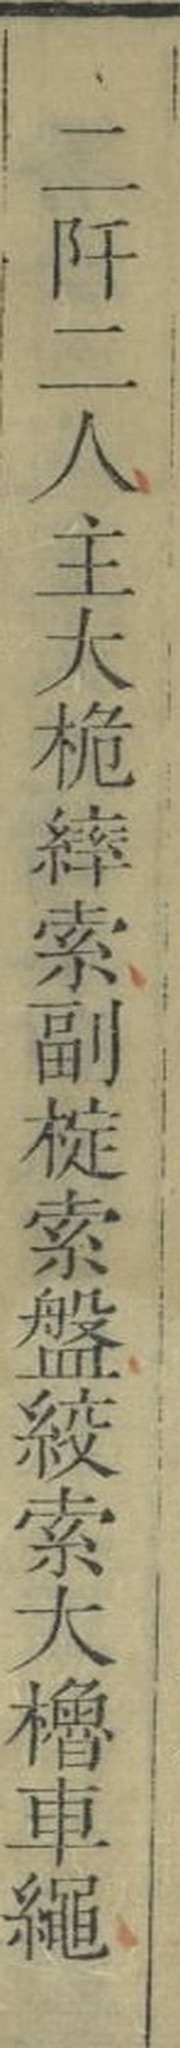二阡二人主大桅繂索副椗索盤絞索大櫓車繩
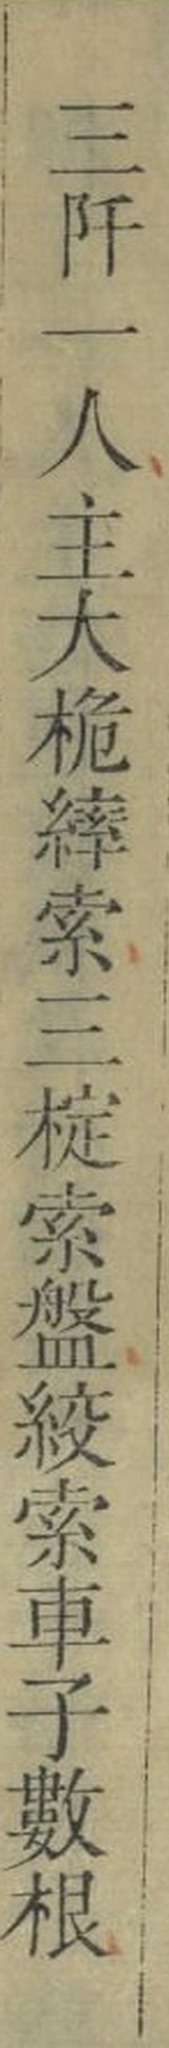三阡一人主大桅繂索三椗索盤絞索車子數根
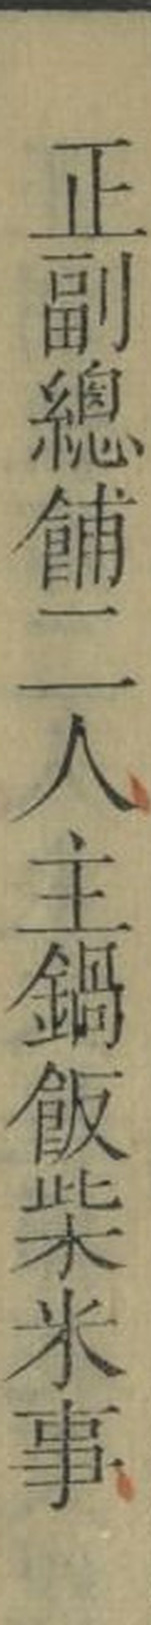正副總餔二人主鍋飯柴米事
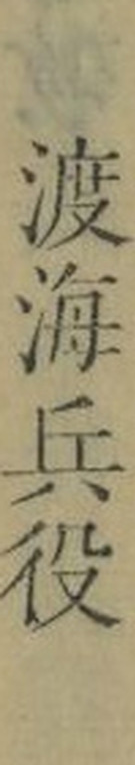渡海兵役
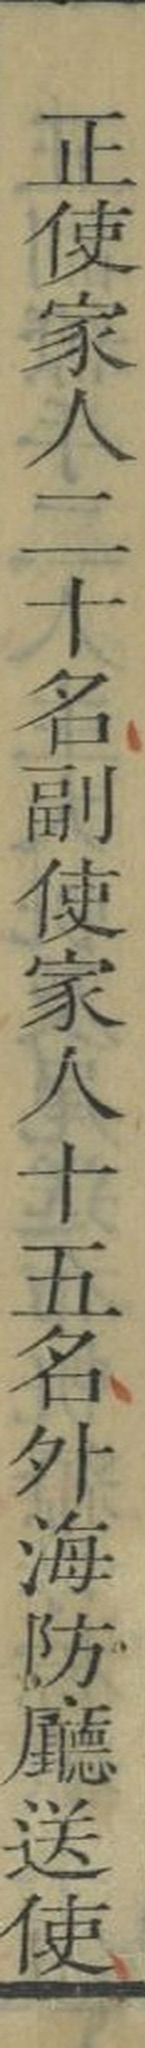正使家人二十名副使家人十五名外海防㕔送使
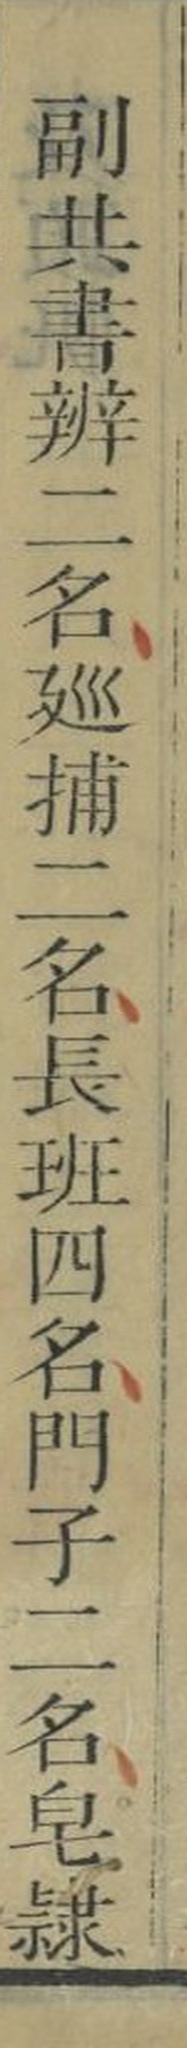副共書辨二名廵捕二名長班四名門子二名皂隷
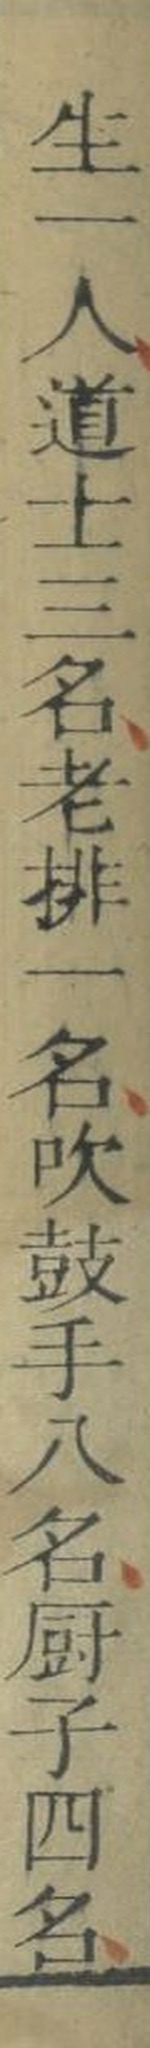生一人道士三名老排一名吹鼓手八名厨子四名
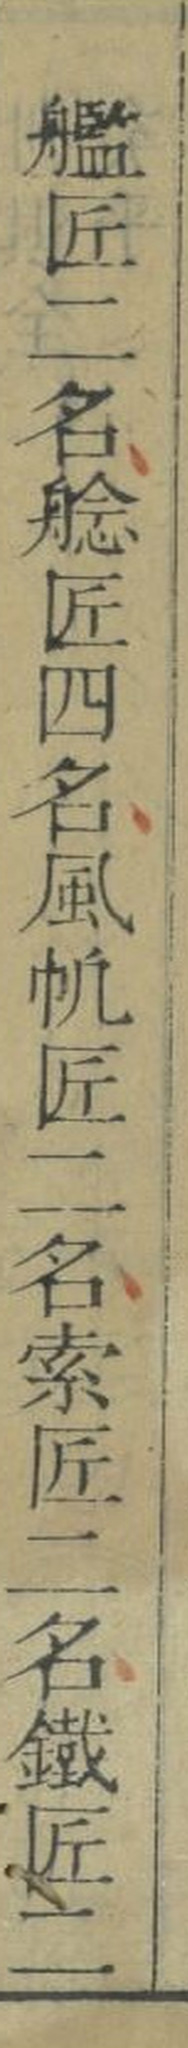艦匠二名艌匠四名風帆匠二名索匠二名鐵匠二
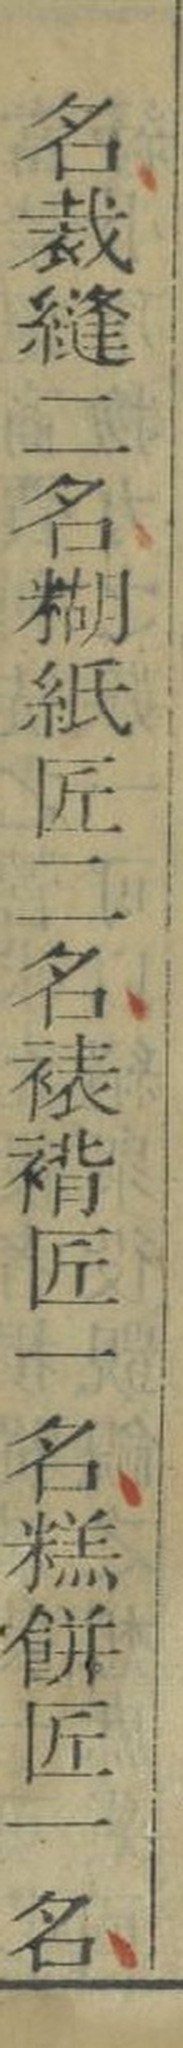名裁縫二名糊紙匠二名裱褙匠一名糕餅匠一名

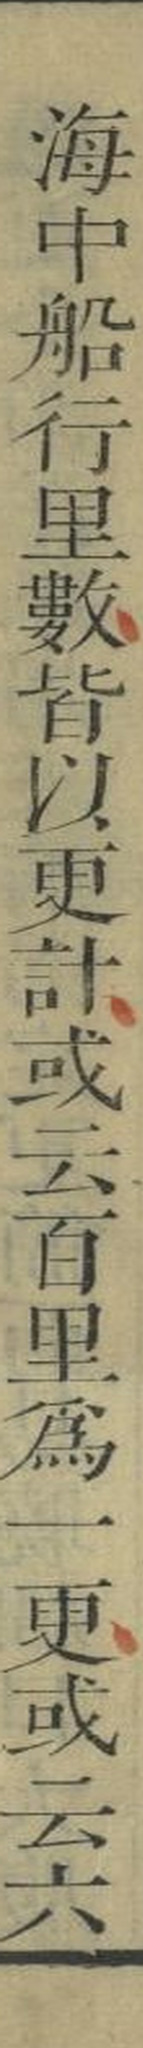海中船行里數皆以更計或云百里爲一更或云六
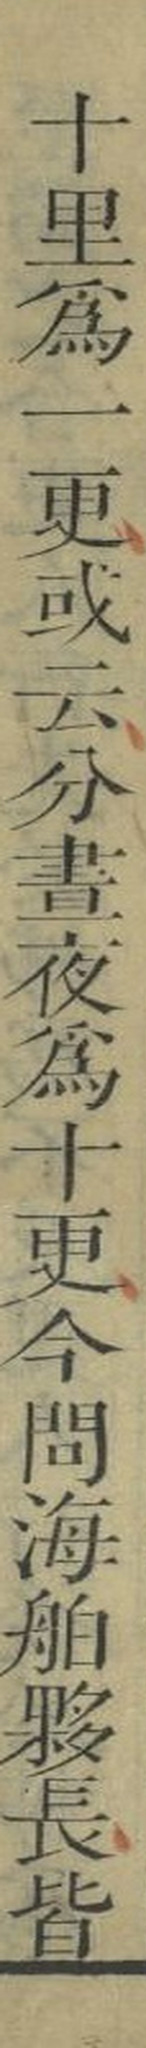十里爲一更或云分晝夜爲十更今問海舶夥長皆
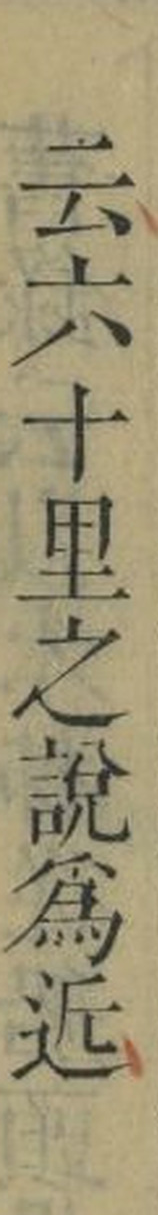云六十里之說爲近

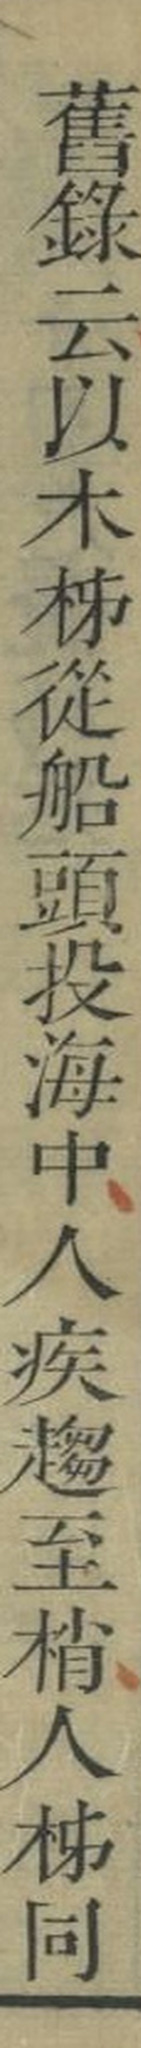舊錄云以木柹從船頭投海中人疾趨至梢人柹同
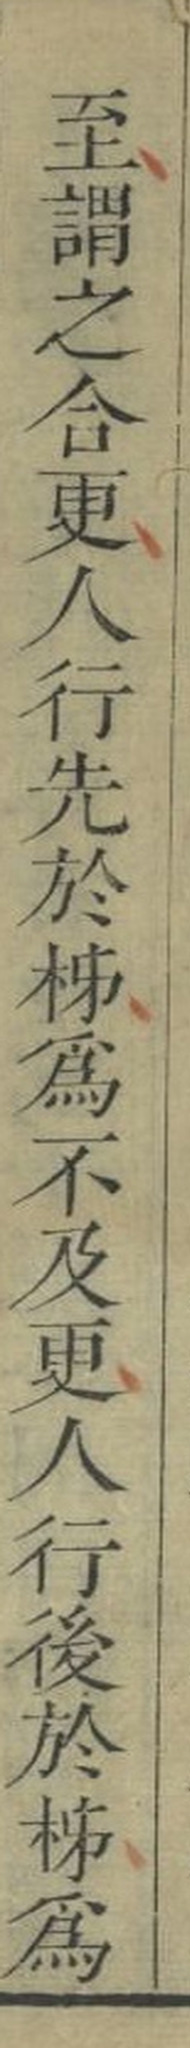至謂之合更人行先於柹爲不及更人行後於柹爲
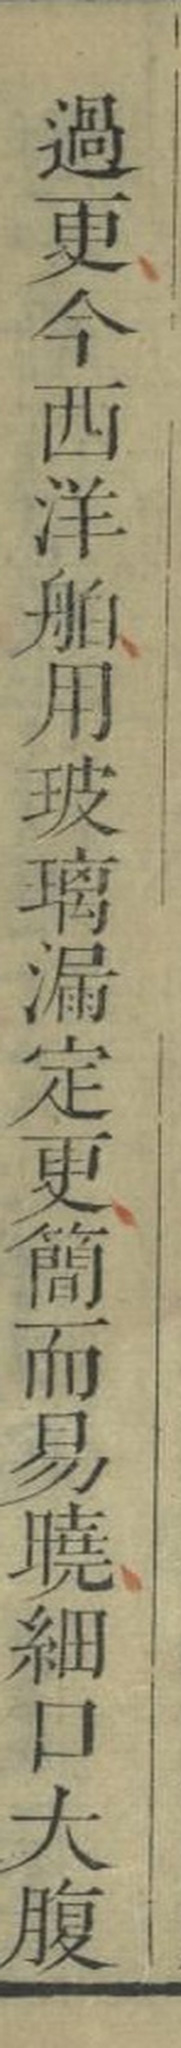過更今西洋舶用玻璃漏定更簡而易曉細口大腹
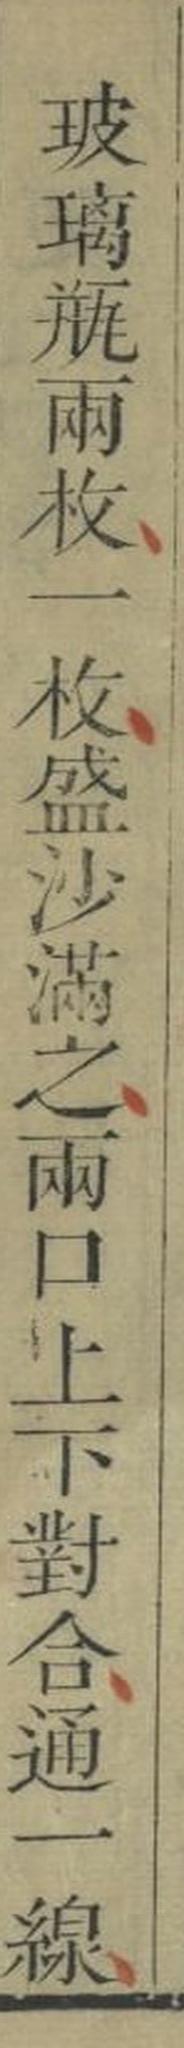玻璃瓶兩枚一枚盛沙滿之兩口上下對合通一線
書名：中山伝信録 巻一、巻二
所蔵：University of the Ryukyus Library
